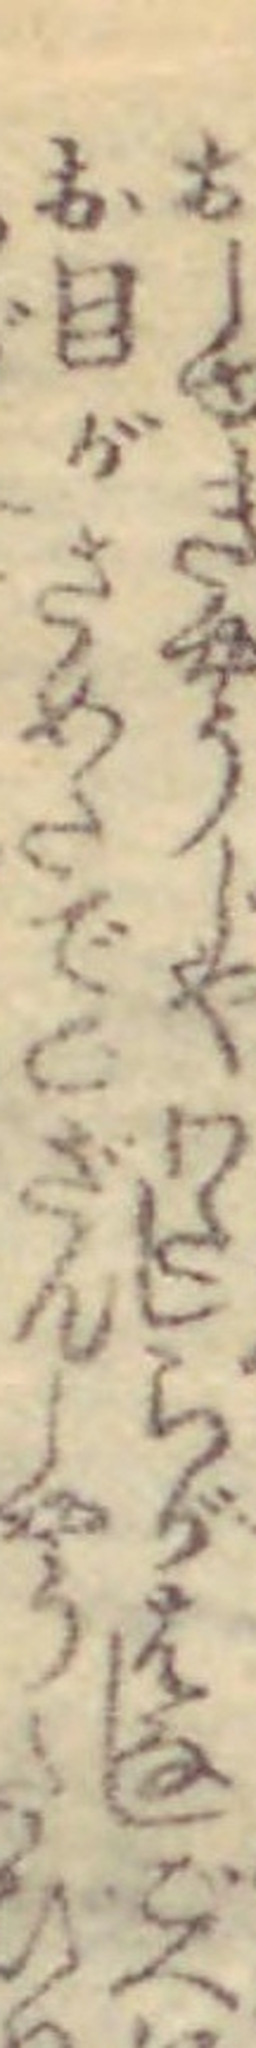お目がさめたでござんしやうたびは
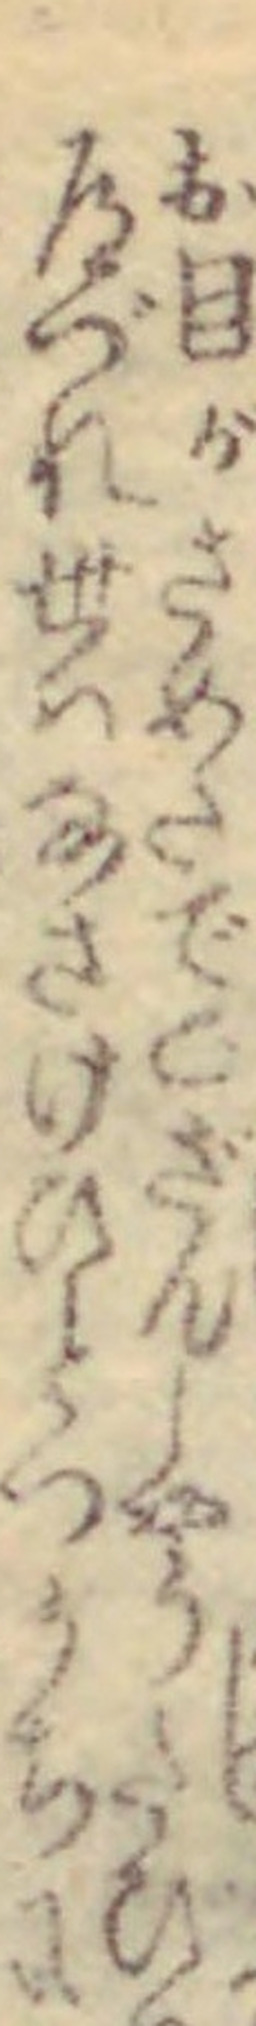道づれ世はなさけひとつうちに
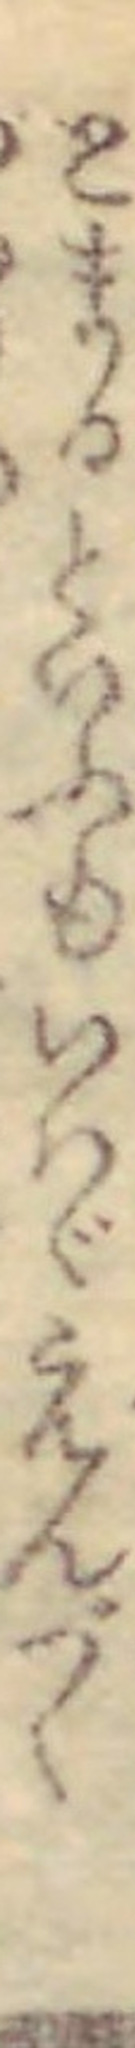とまるといふもいはゞえんづく
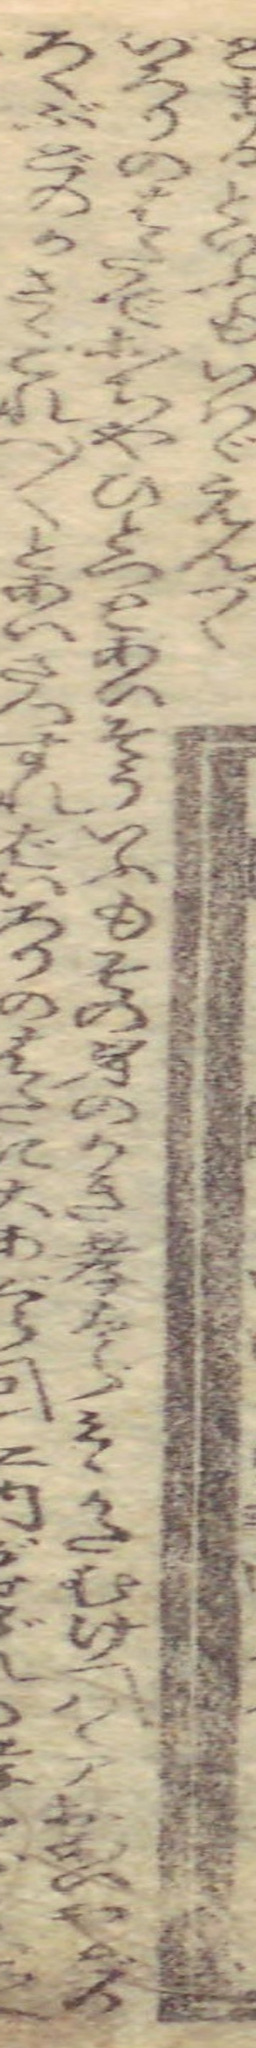いろりのはたでおちやひとつとあいそういふもその身のかき孝太郎みゝかたむけ〽ハヽアおあいやどの
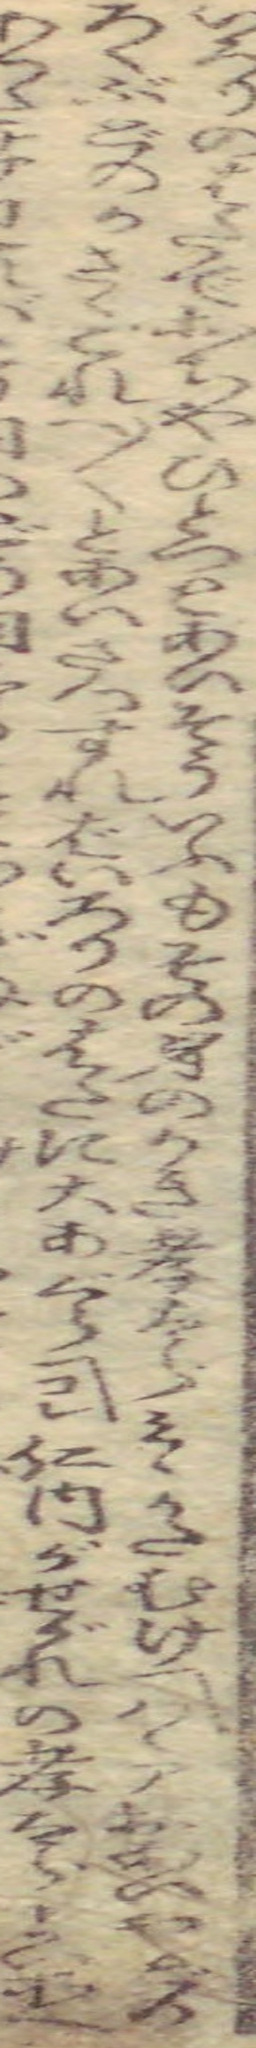ろくぶどのかさゝこれへ〳〵あいさつすればいろりのはたに大あぐら〽コレ仁内のせがれの孝太郎よい所へ
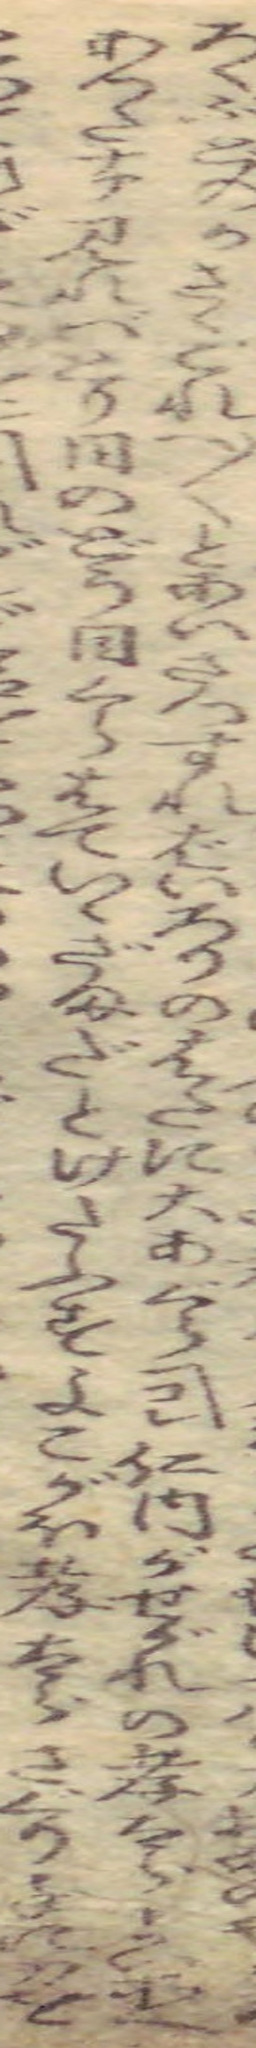あつたナア見ればとり目のどう目くらはていゝざまだとけたふすよこがほ孝太郎さぐり手に刀を
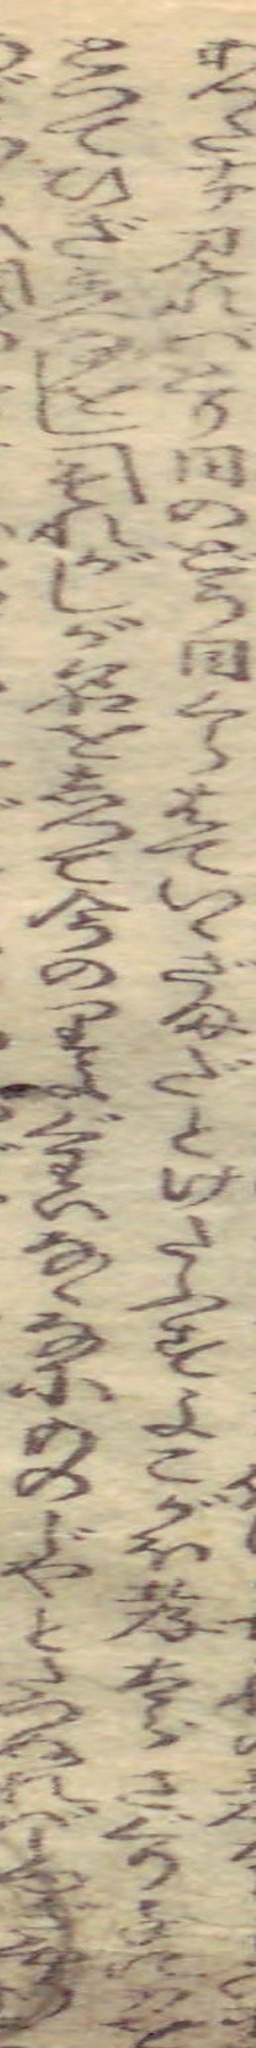とつてひざまへなをし〽それがしが名をしつて今のりよぐわいなくなにものじやとたつぬればしゆぎやうじやは
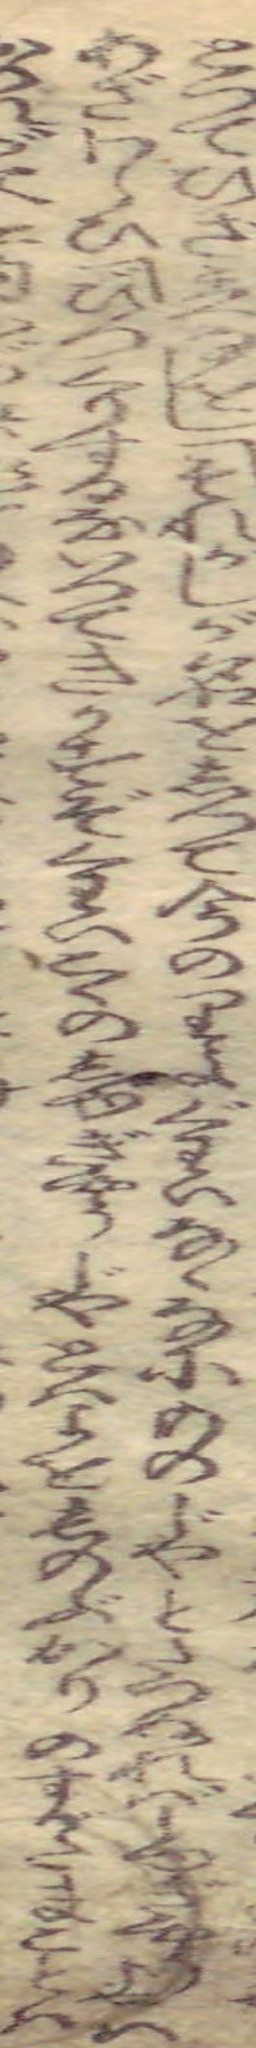あざわらひ〽びつくりするないつてきかすぞくわいこくのしゆぎやうじやとはよをしのぶかりのすがたまことは
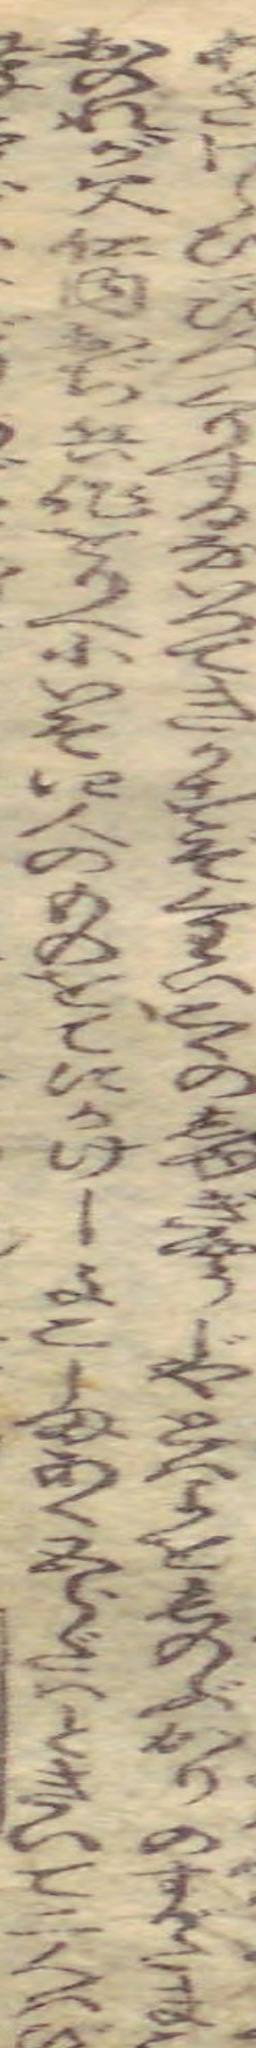おのれが父仁内おぢ兵作をりへ小いそ四人のものをてにかけしよこしまあく五郎だはときいて二人はびつくりし
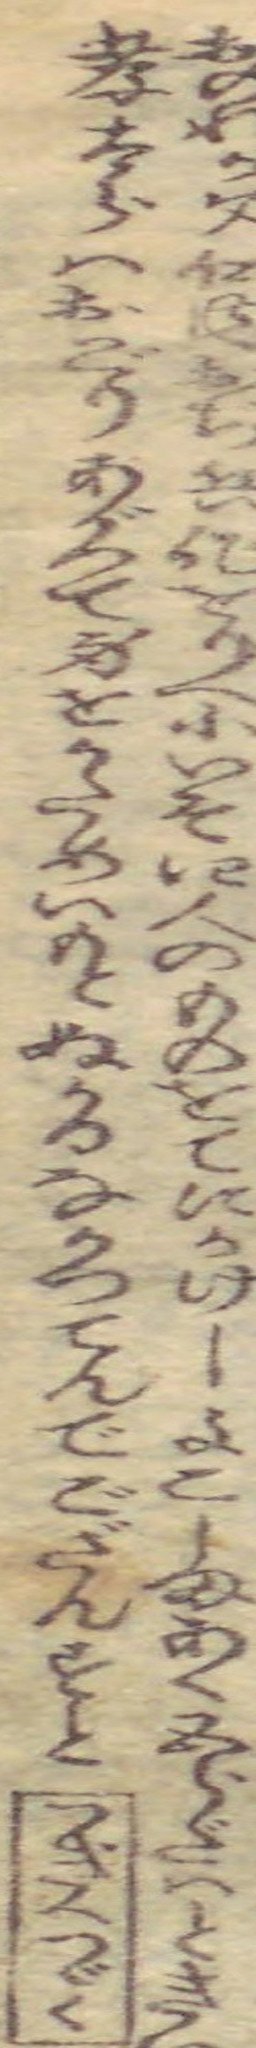孝太郎はおどりあがつて身をかためいもとぬかるなかつてんでござんすと「つぎへつゞく」

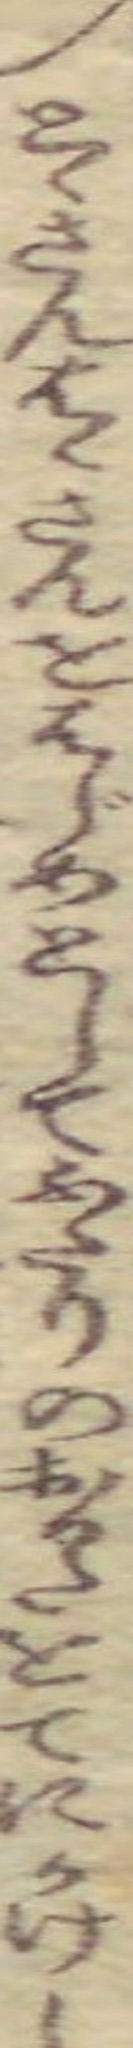とゝさんはゝさんをはじめとしてふたりのおかたをてにかけし
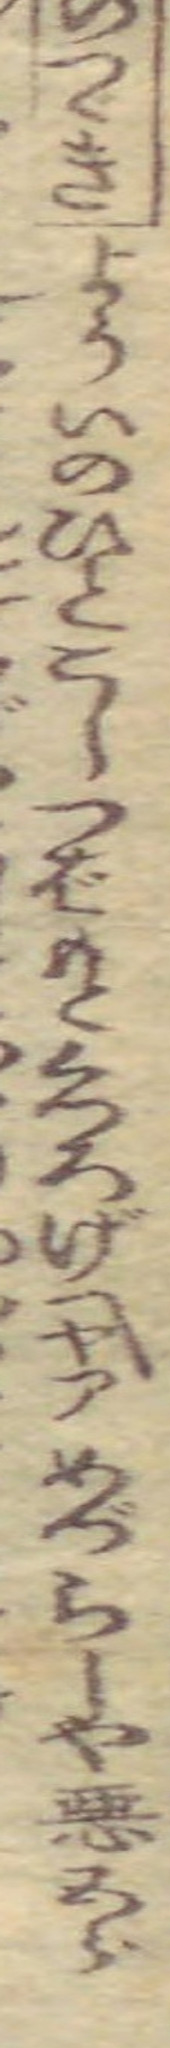「まへのつゞき」よういのひとこしつばもとくつろげ〽ヤアめづらしや悪五郎
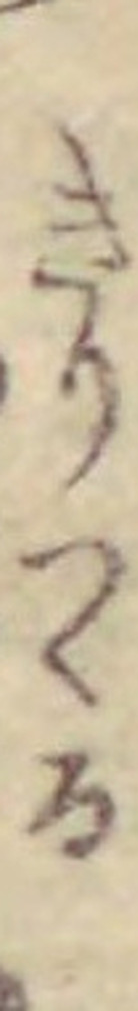きりつくる
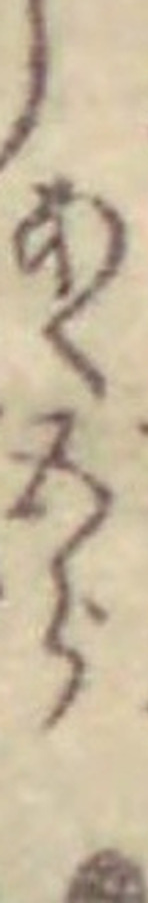あく五郎
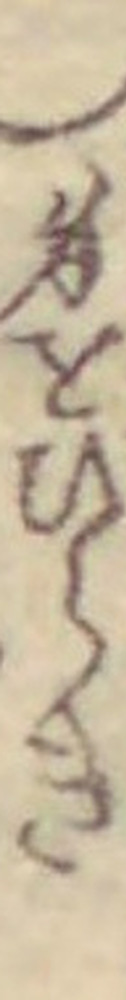身をひらき
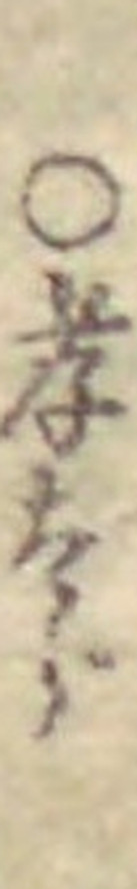○孝太郎
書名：八ツ目鱣因縁物語 3巻
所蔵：国立国会図書館 National Diet Library, JAPAN
